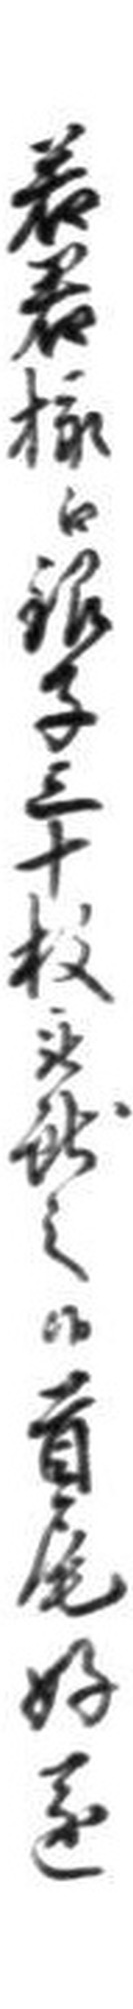若君様江銀子三十枚被献之候首尾好遂
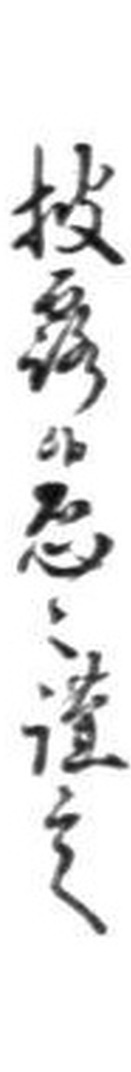披露候恐々謹言
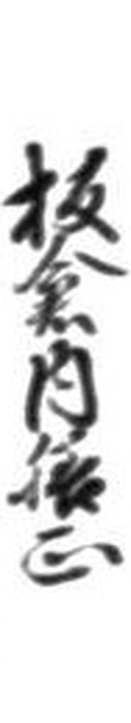板倉内膳正
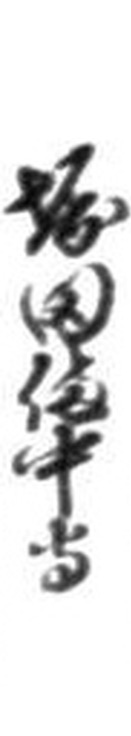堀田備中守
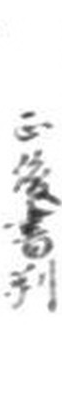正俊書判
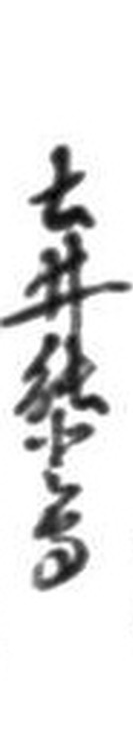土井能登守
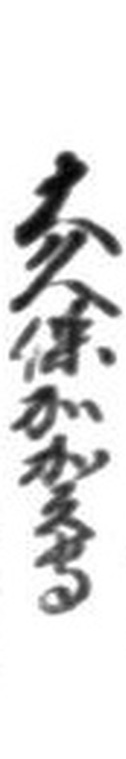大久保加賀守
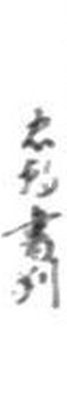忠朝書判
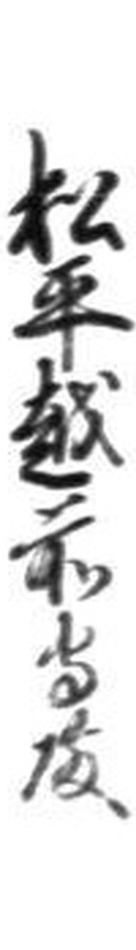松平越前守殿

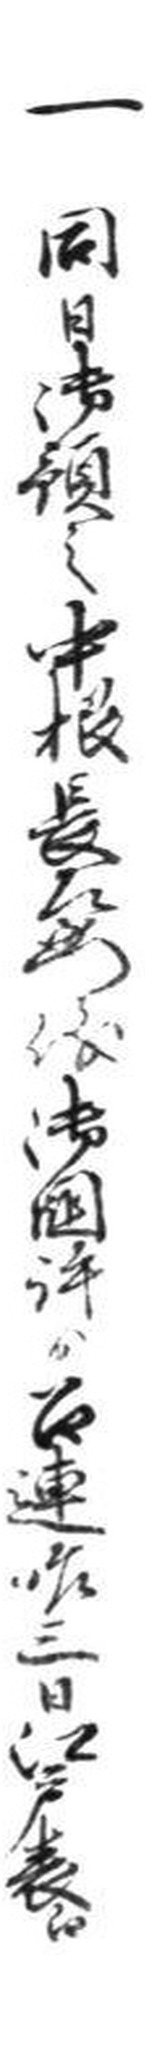一同日御領之中根長左衛門儀御国許ゟ召連昨三日江戸表江
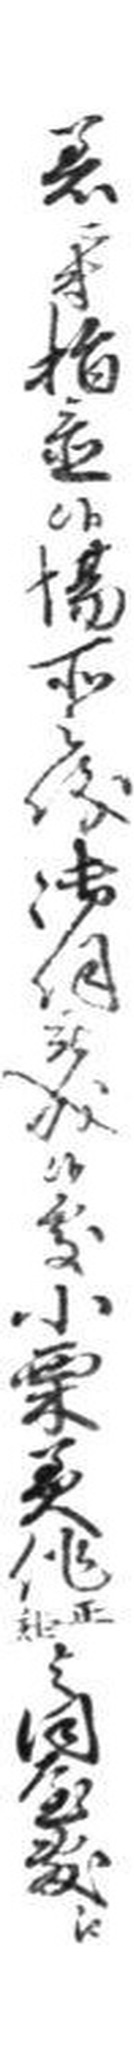着ニ付指置候場所之儀御伺被成候処小栗美作正矩と同屋敷江
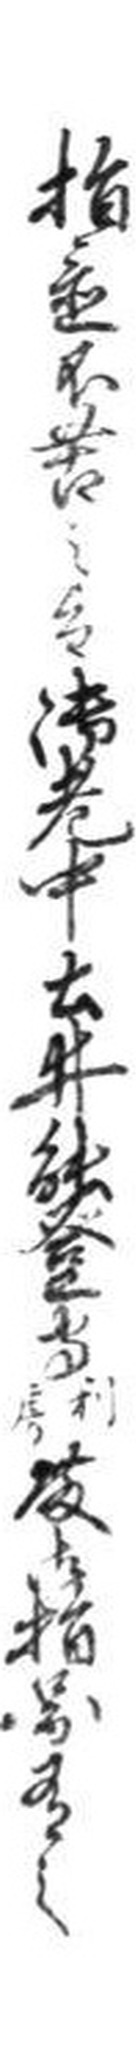指置不苦之旨御老中土井能登守利房殿御指図有之
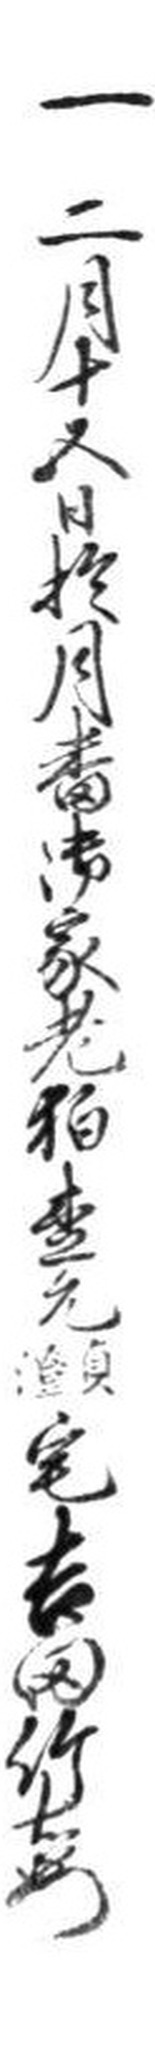一二月十五日拾月番御家老狛杢允貞澄宅吉田竹右衛門
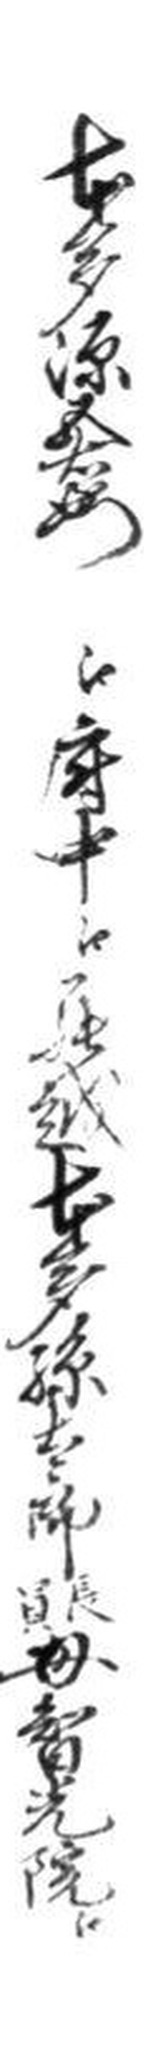本多源五右衛門江府中江罷越本多孫太郎長員母智光院江
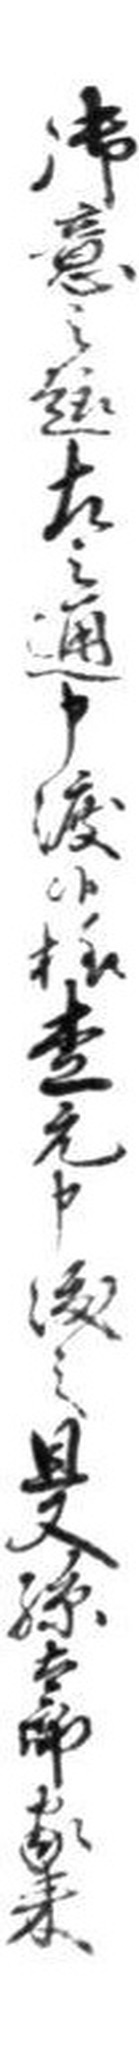御意之趣左之通申渡候様杢允申渡之且又孫太郎家来
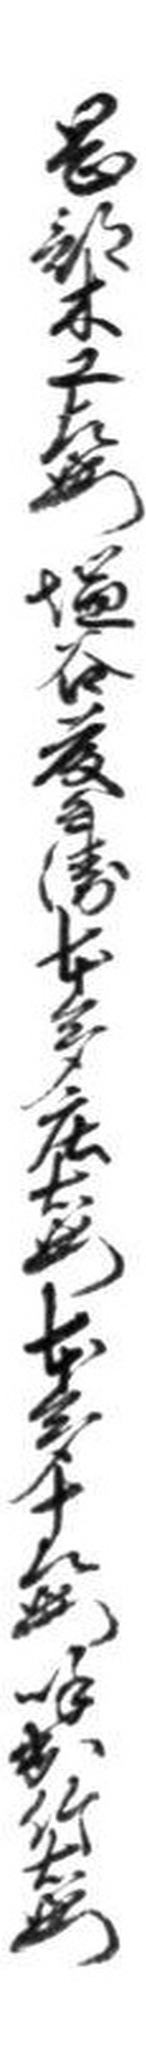岡部木工左衛門塩谷藤兵衛本多庄右衛門本多十左衛門呼出竹右衛門
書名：家譜 十五 綱昌公 従天和元年到元禄十二年
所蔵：福井県文書館 Fukui Prefectural Archives
